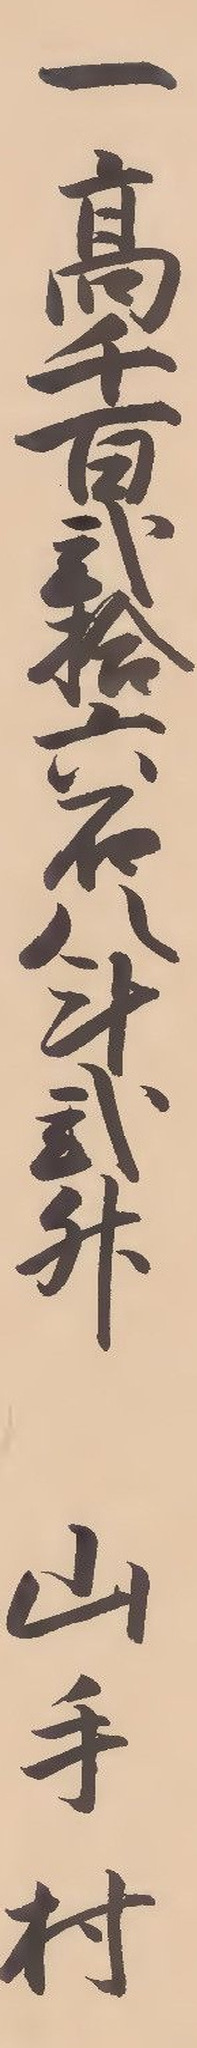一髙千百弐拾六石八斗弐升山手村
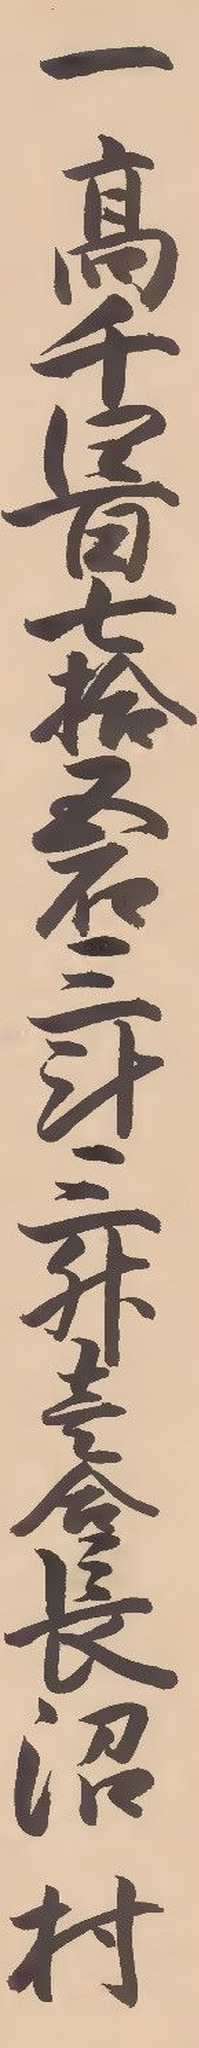一髙千四百七拾五石三斗三升壱合長沼村
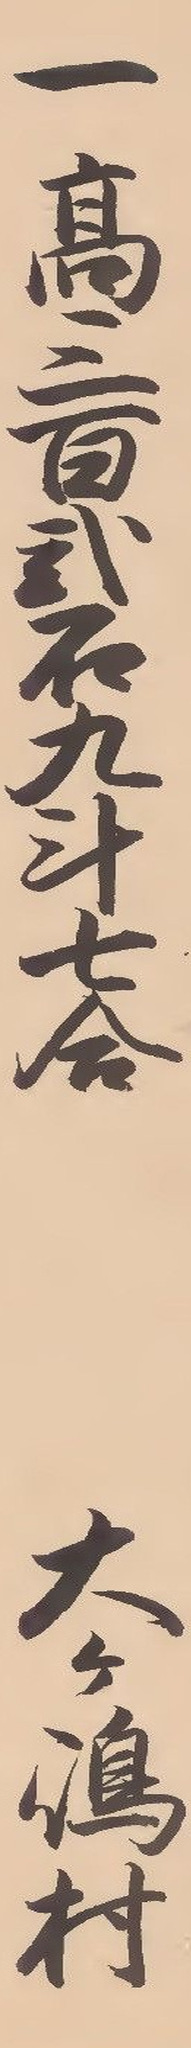一髙三百弐石九斗七合大ケ嶋村
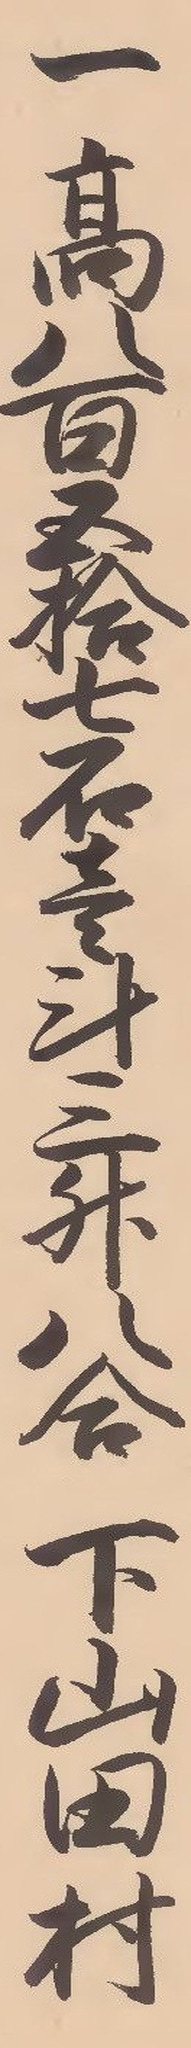一髙八百五拾七石壱斗三升八合下山田村
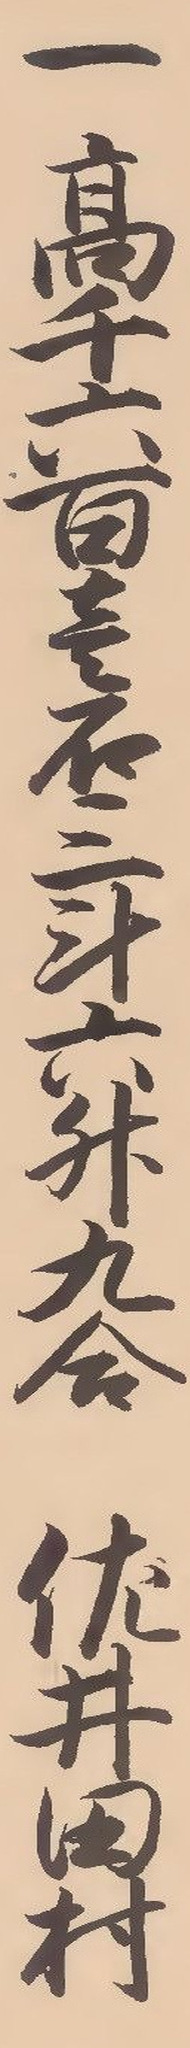一髙千六百壱石三斗六升九合佐井田村
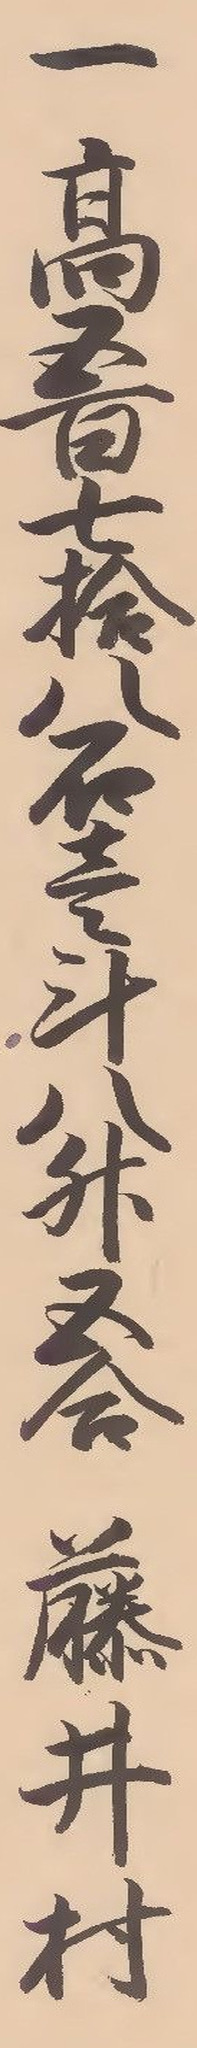一髙五百七拾八石壱斗八升五合藤井村

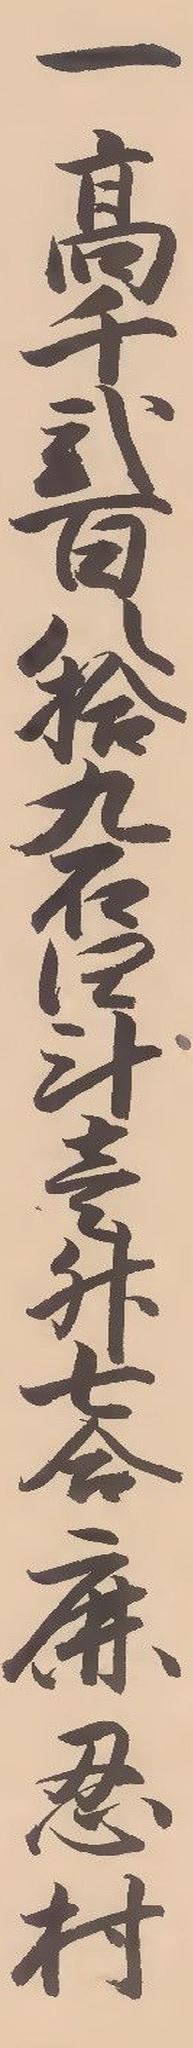一髙千弐百八拾九石四斗壱升七合鹿忍村
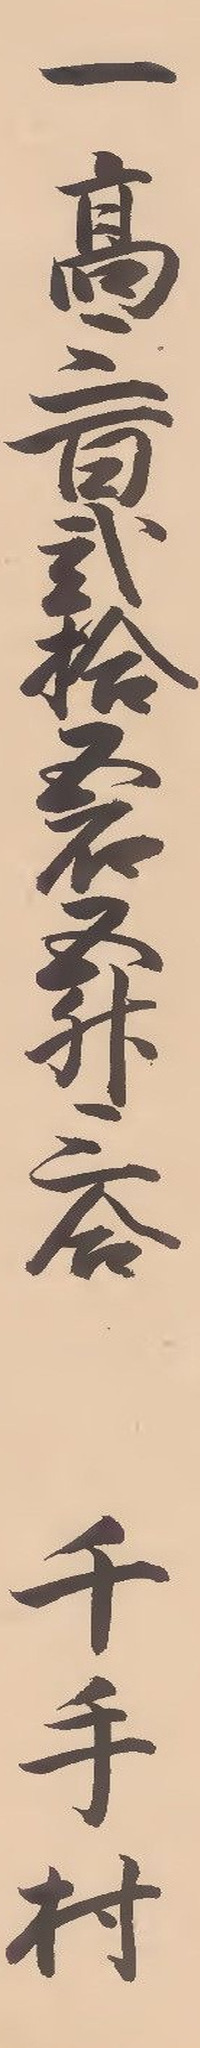一髙三百弐拾五石五升三合千手村
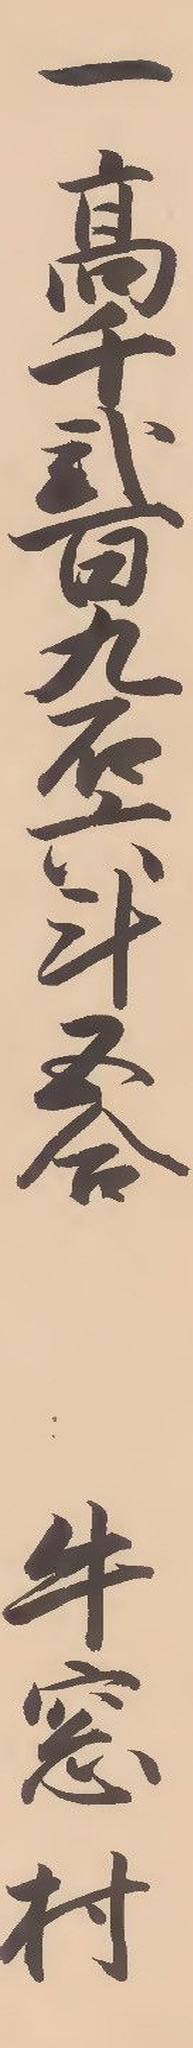一髙千弐百九石六斗五合牛窓村
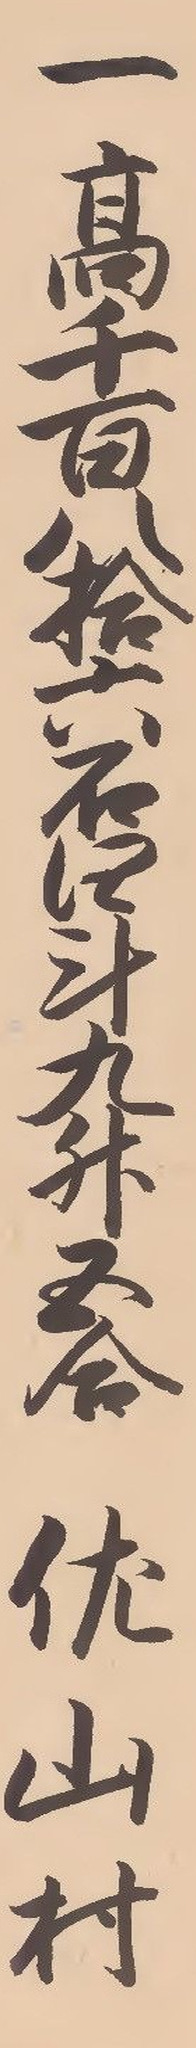一髙千百八拾六石四斗九升五合佐山村
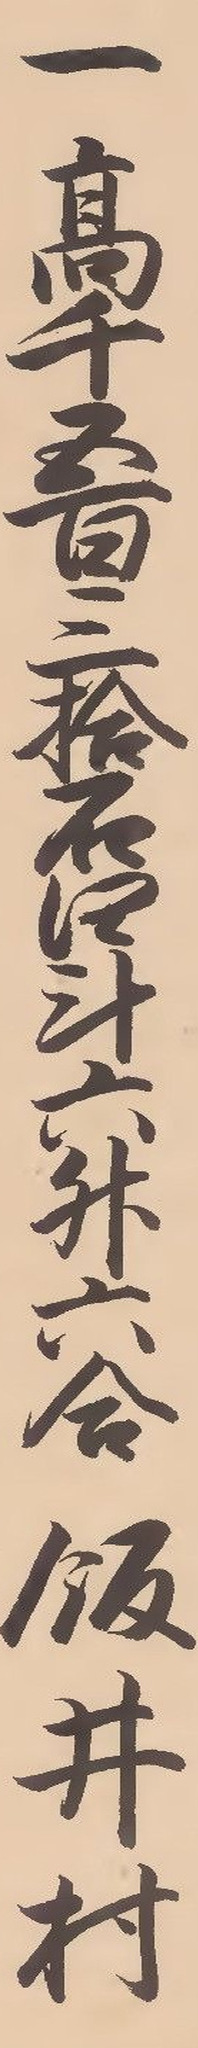一髙千五百三拾石四斗六升六合飯井村
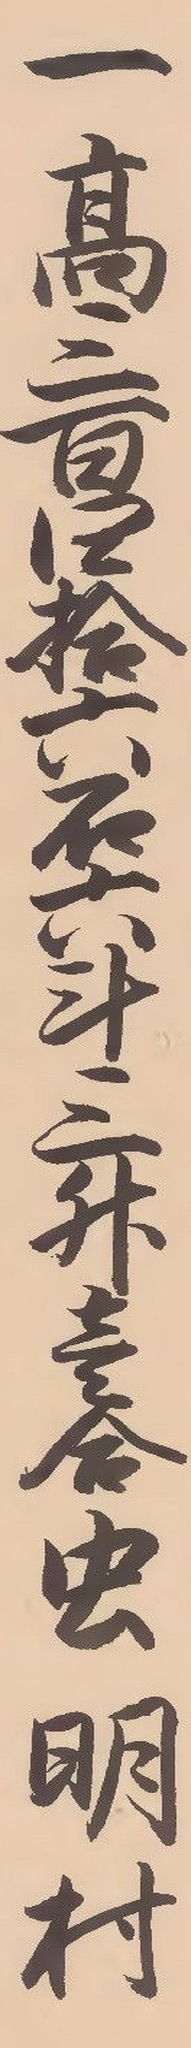一髙三百四拾六石六斗三升壱合虫明村
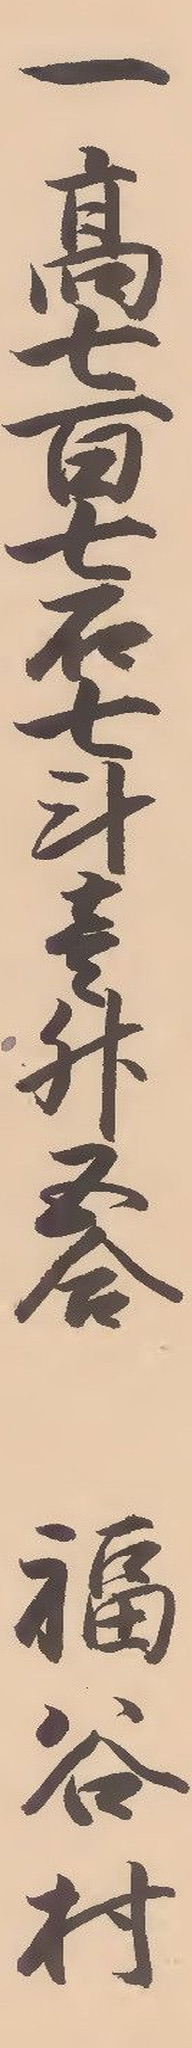一髙七百七石七斗壱升五合福谷村

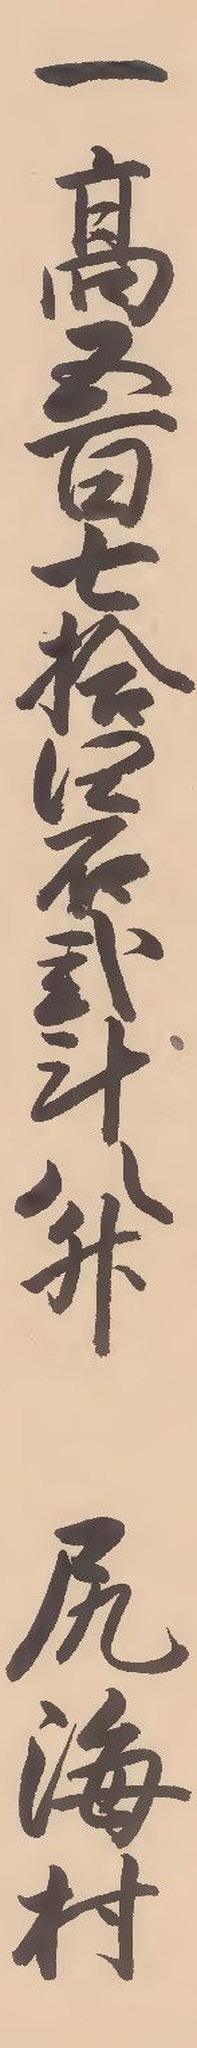一髙五百七拾四石弐升八升尻海村
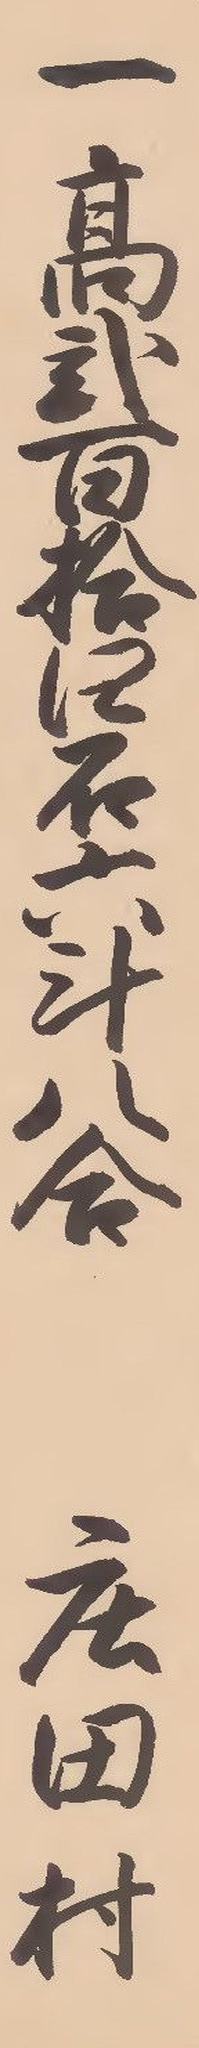一髙弐百拾四石六斗八合庄田村
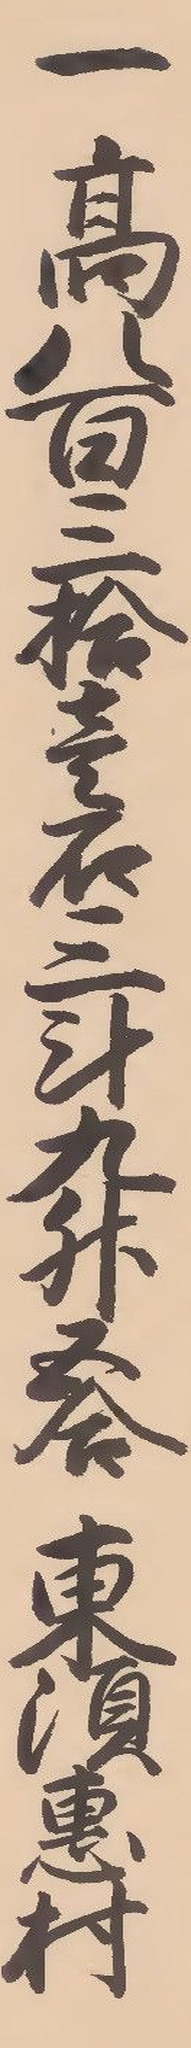一髙八百三拾壱石三斗九升五合東須恵村
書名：備前国郷帳
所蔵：国立公文書館 National Archives of Japan
